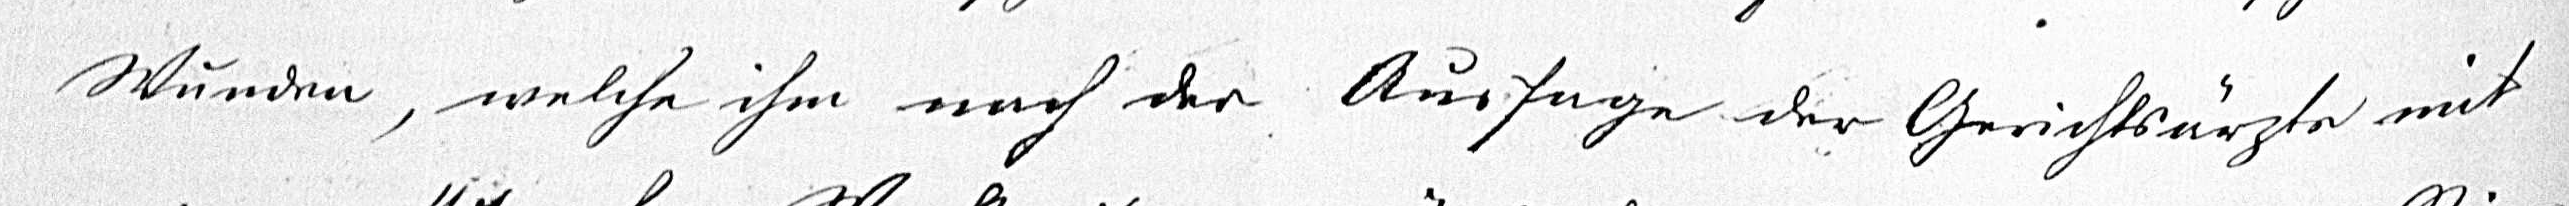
Wunden, welche ihm nach der Aussage der Gerichtsärzte mit
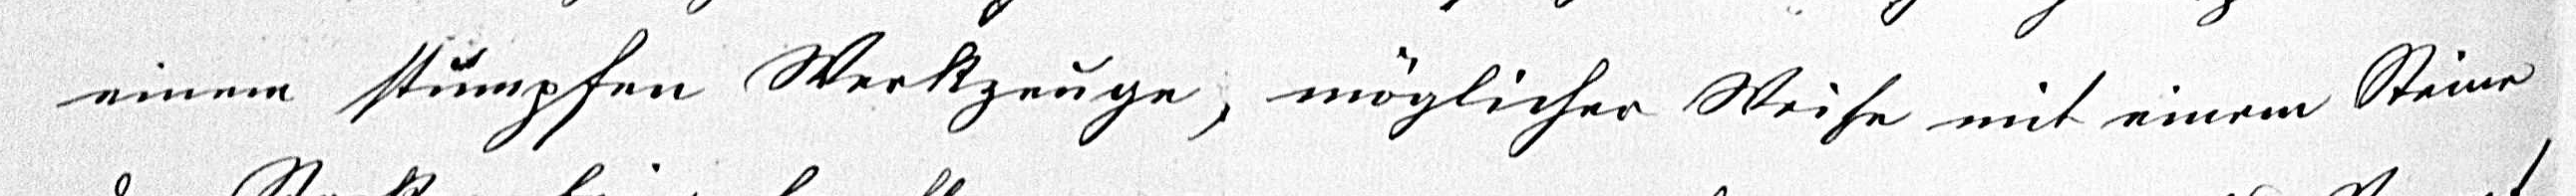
einem stumpfen Werkzeuge, möglicher Weise mit einem Steine
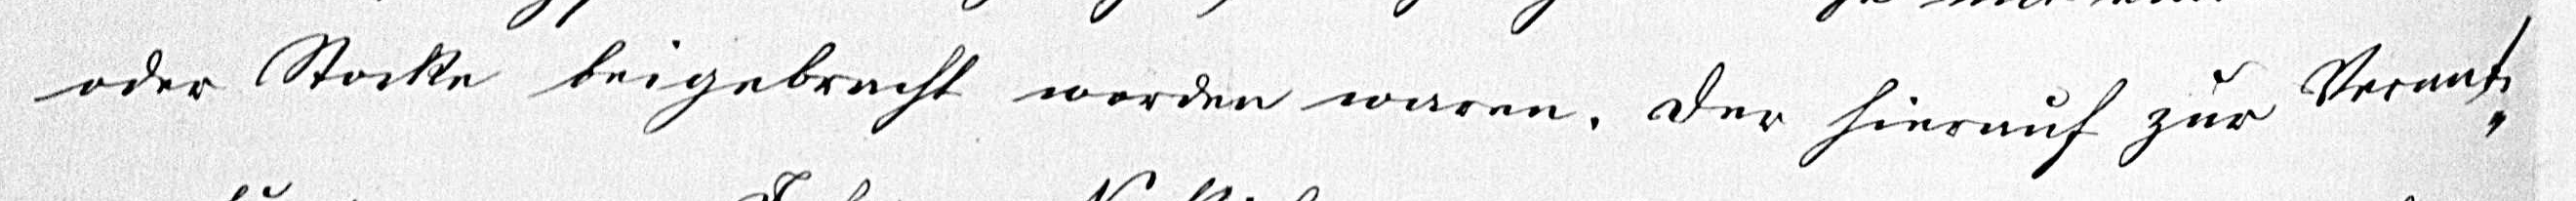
oder Stocke beigebracht werden waren. Der hierauf zur Verant¬
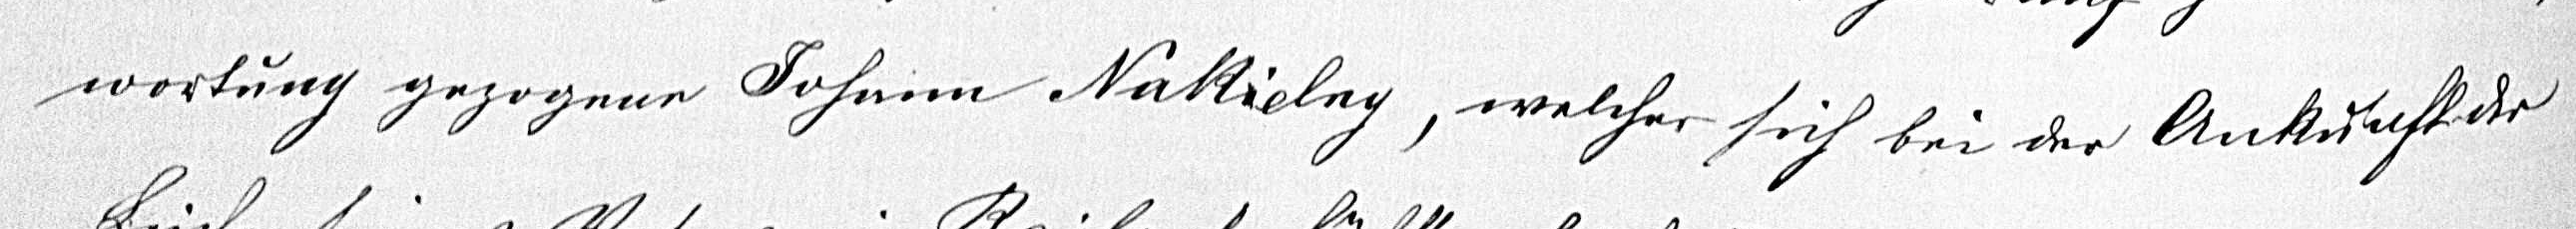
wortung gezogene Johann Nakielny, welcher sich bei der Ankunft den
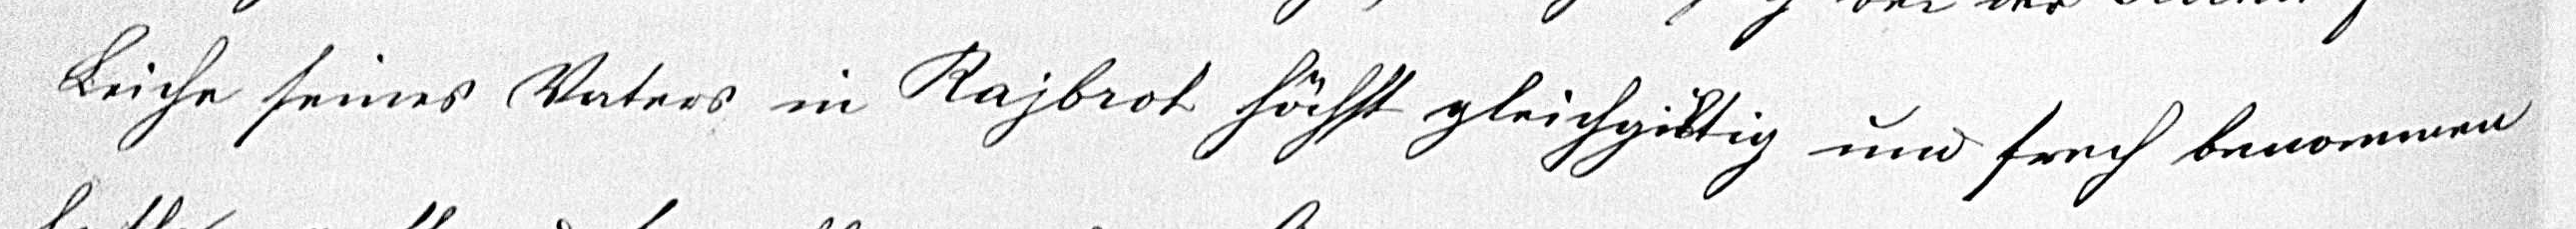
Leiche seines Vaters in Rajbrot höchst gleichgültig und frech benommen
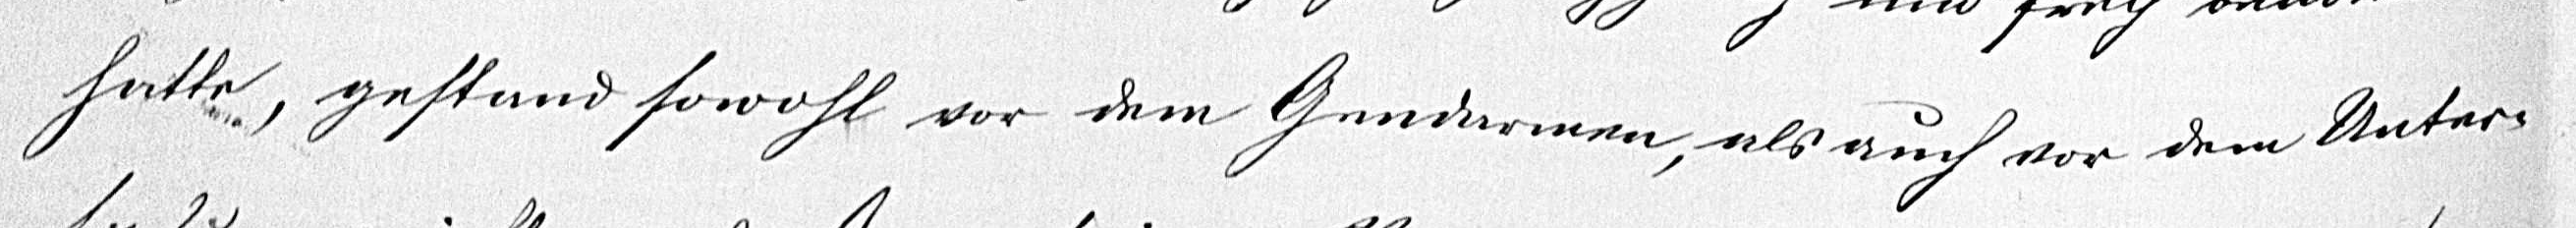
hatte, gestand sowohl vor dem Gandarmen, als auch vor dem Unter¬
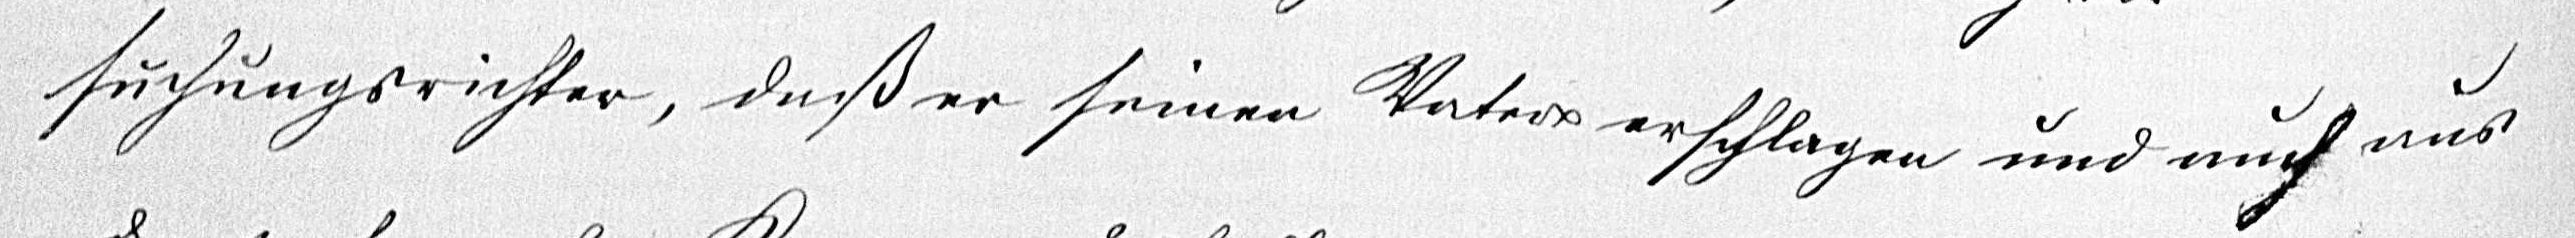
suchungsrichter, daß er seinen Vaters erschlagen und auch aus
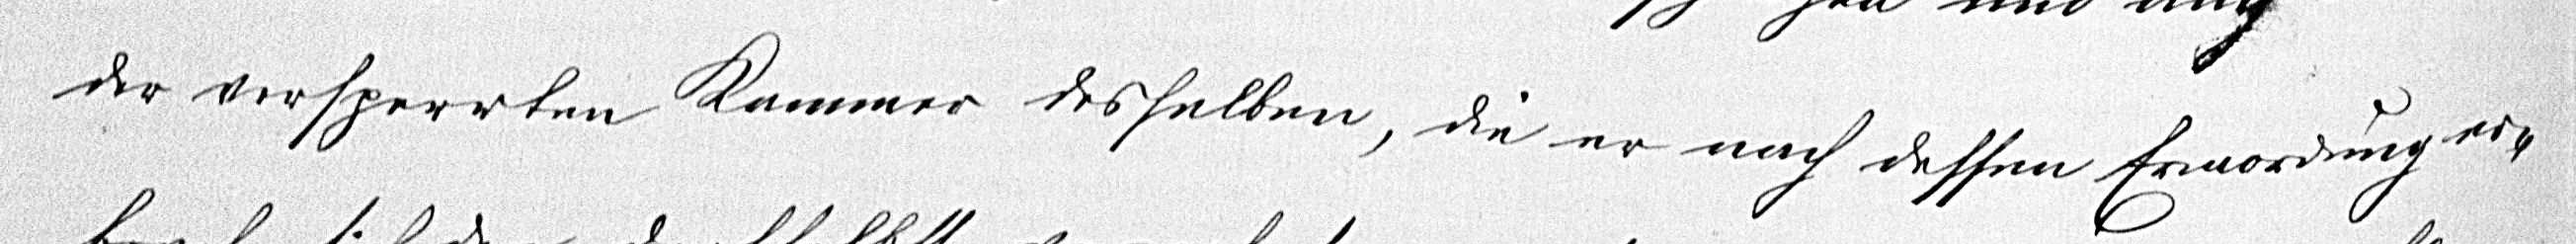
der versperrten Kammer desselben, die er nach dessen Ermordung er¬
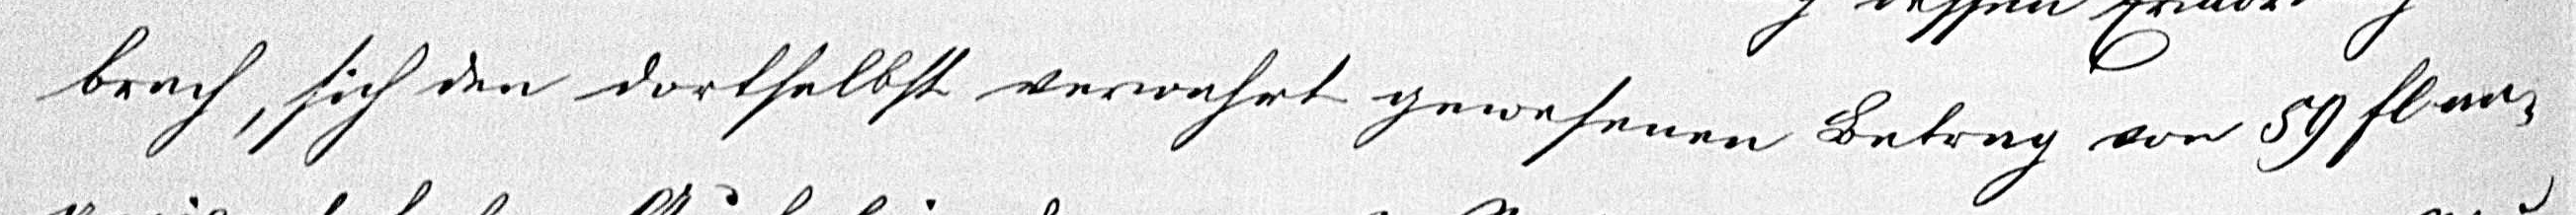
brach, sich den dortselbst verwahrt gewesenen Betrag von 59 fl an¬
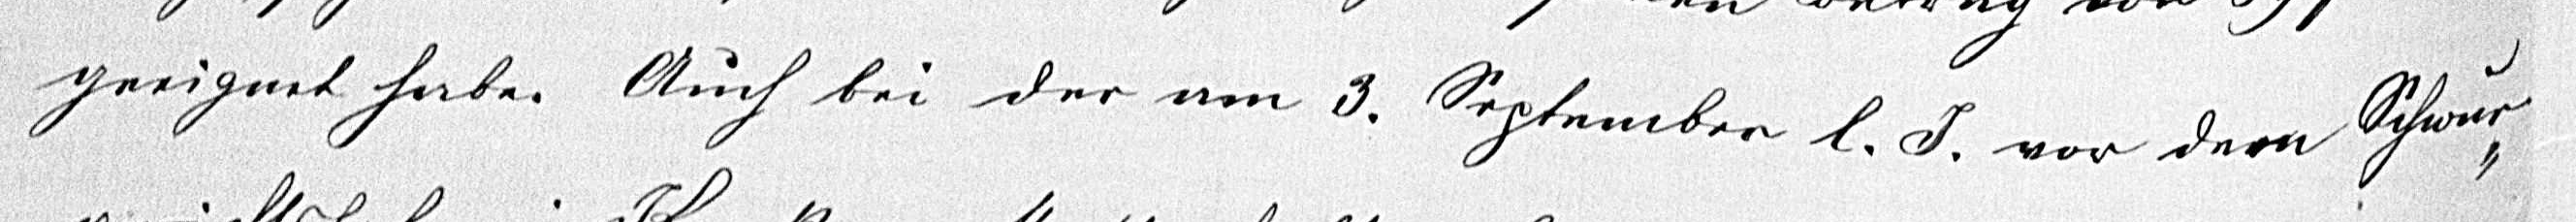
geeignet habe. Auch bei der am 3. September l. J. vor dem Schwur¬
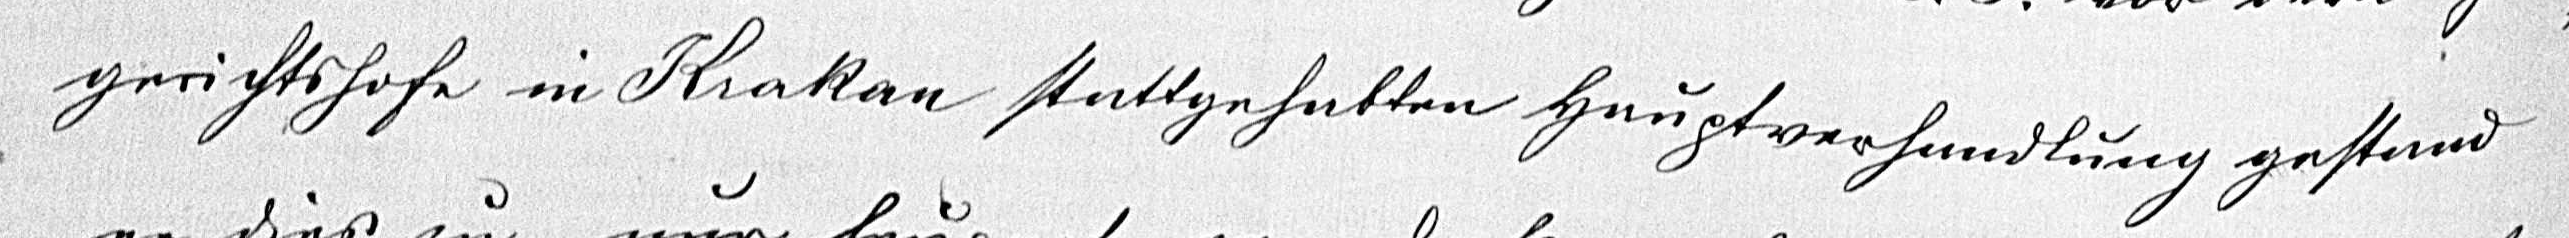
gerichtshofe in Krakan stattgehabten Hauptverhandlung gestand
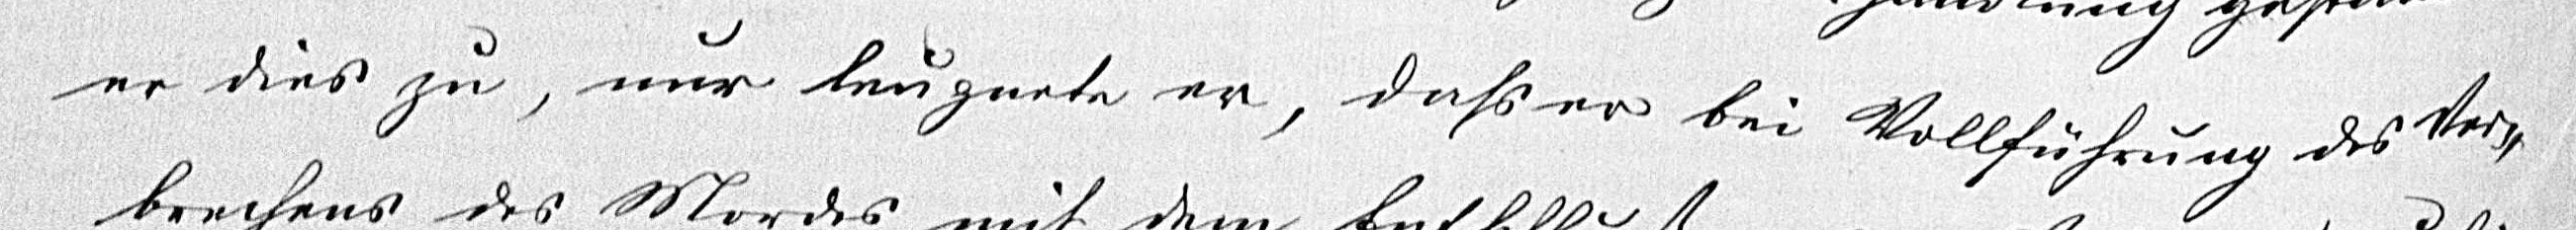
er dies zu, nur leugnete er, daß er bei Vollführung des Ver¬
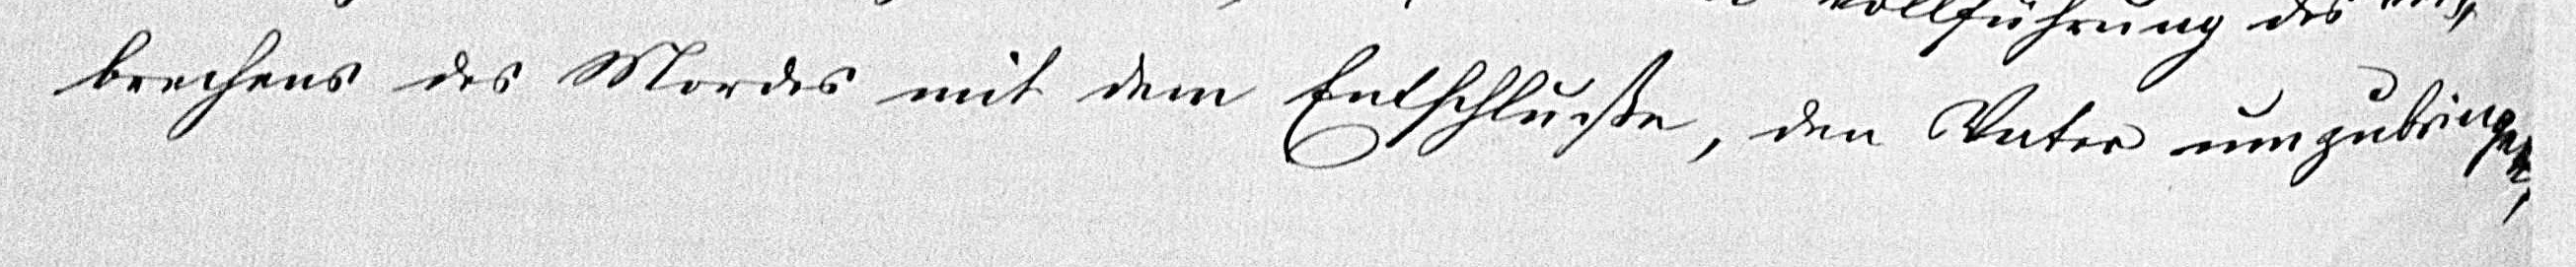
brechens des Mordes mit dem Entschluße, den Vater um zubringen,
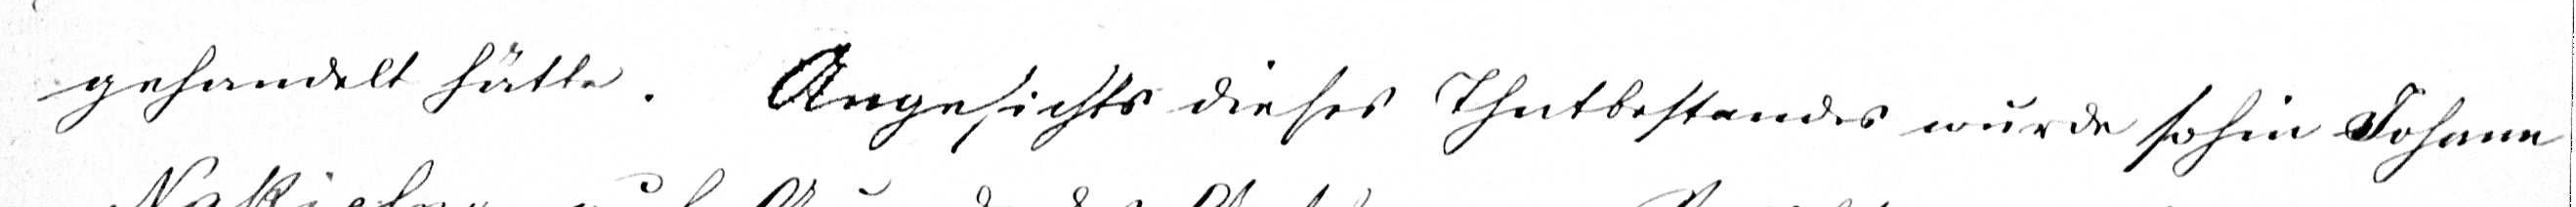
gehandelt hätte. Angesichts dieses Thatbestandes wurde sohin Johann
